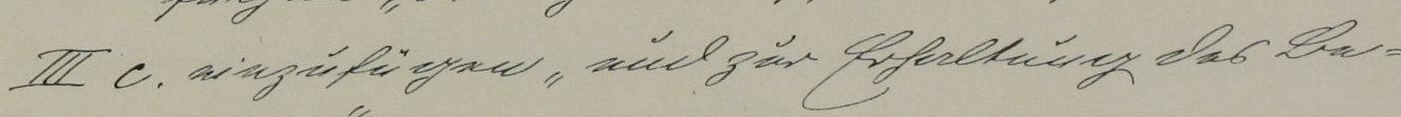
IIIc. einzufügen „und zur Erhaltung des Be-
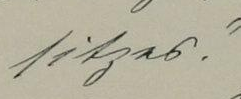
sitzes.“
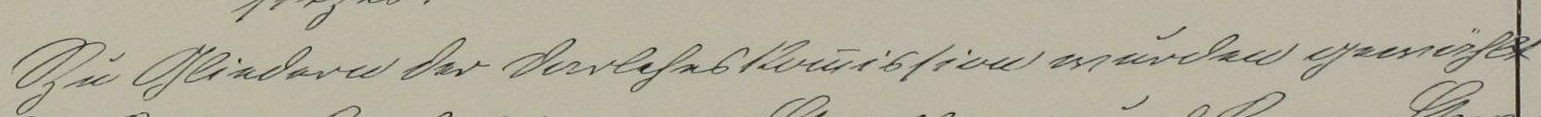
Zu Gliedern der Darlehnskommission wurden gewählt
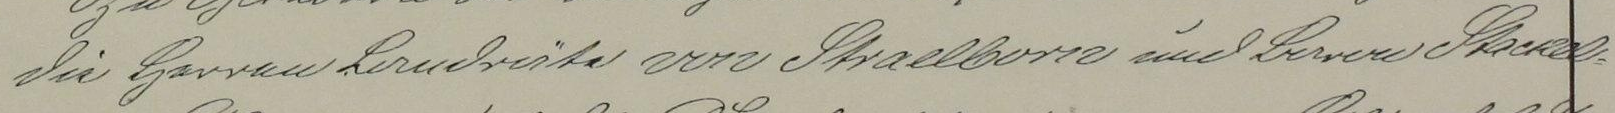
die Herren Landräte von Straelborn und Baron Stackel-
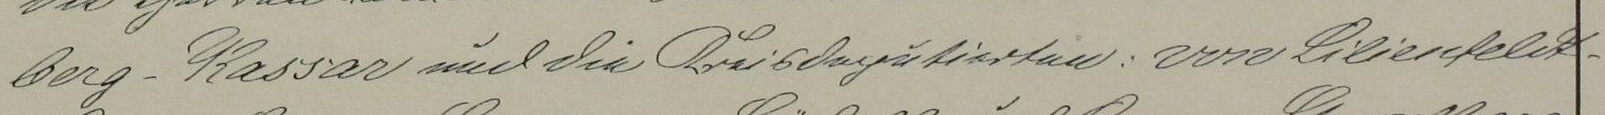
berg-Kassar und die Kreisdeputierten: von Lilienfeldt-
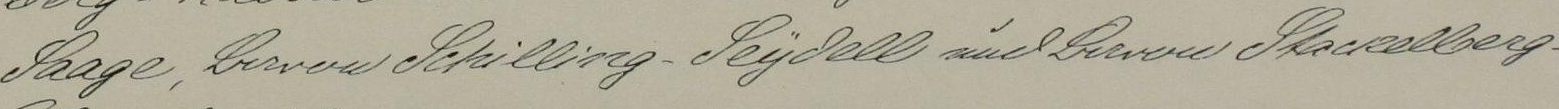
Saage, Baron Schilling-Seydell und Baron Stackelberg-
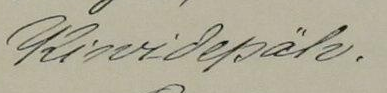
Kiwidepäh.
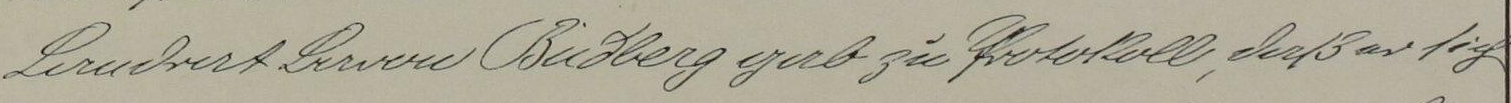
Landrat Baron Budberg gab zu Protokoll, daß er sich
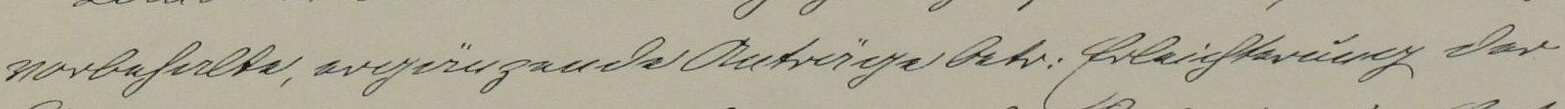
vorbehalte, ergänzende Anträge betr. Erleichterung der
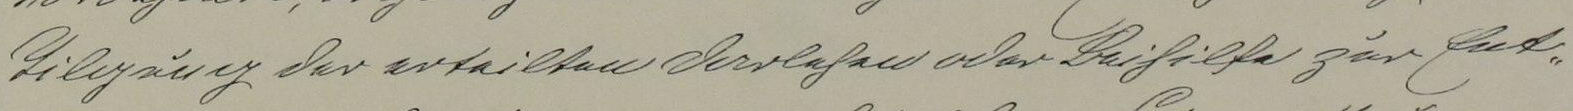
Tilgung der erteilten Darlehen oder Beihilfe zur Ent-
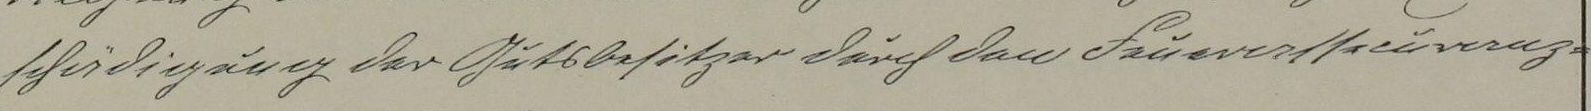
schädigung der Gutsbesitzer durch den Feuerassecuranz-
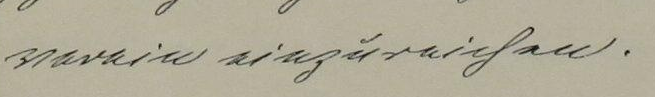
verein einzureichen.
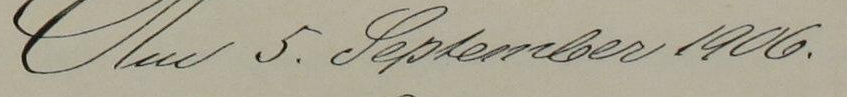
Am 5. September 1906.
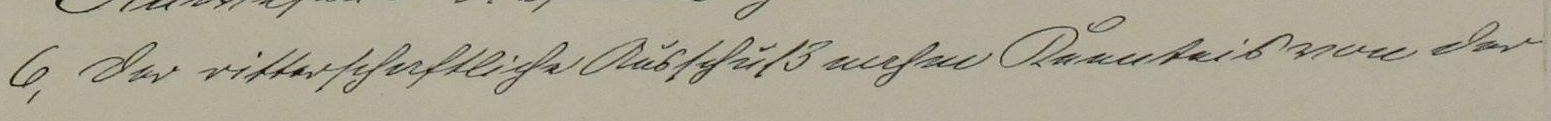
6. Der ritterschaftliche Ausschuß nahm Kenntnis von der
